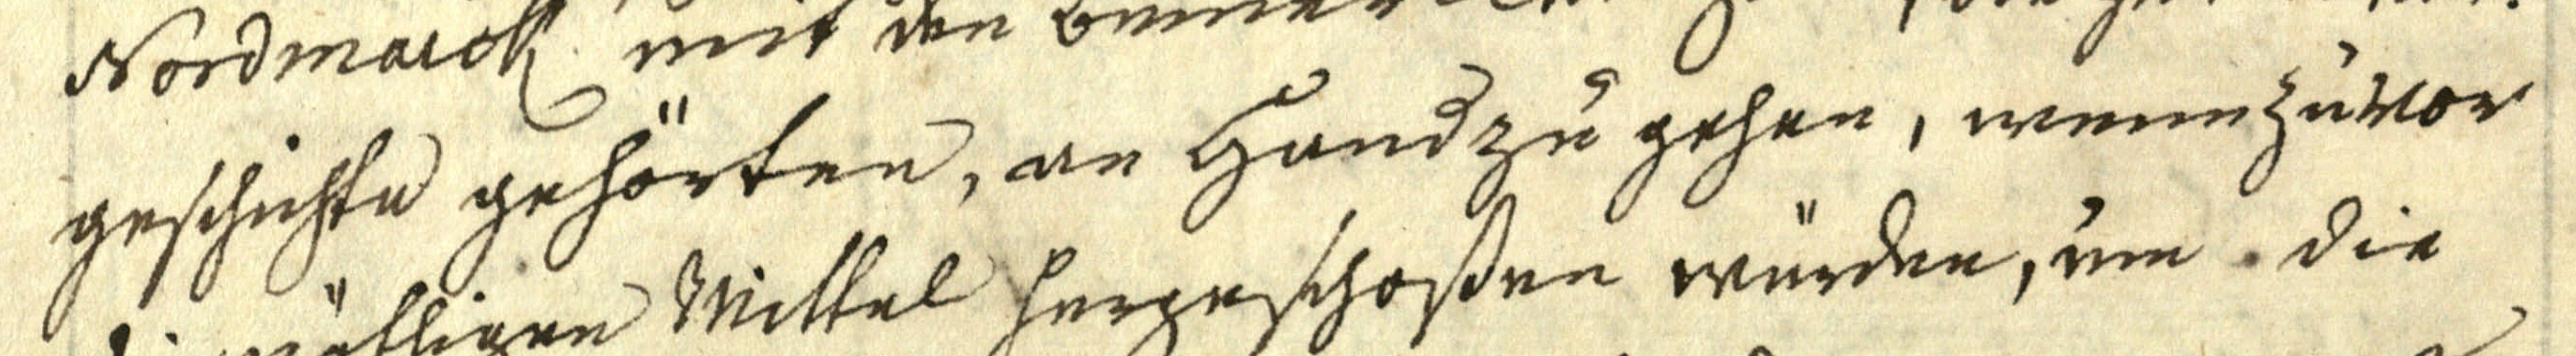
geschichte gehörten, an Hand zu gehen, wenn zuvor
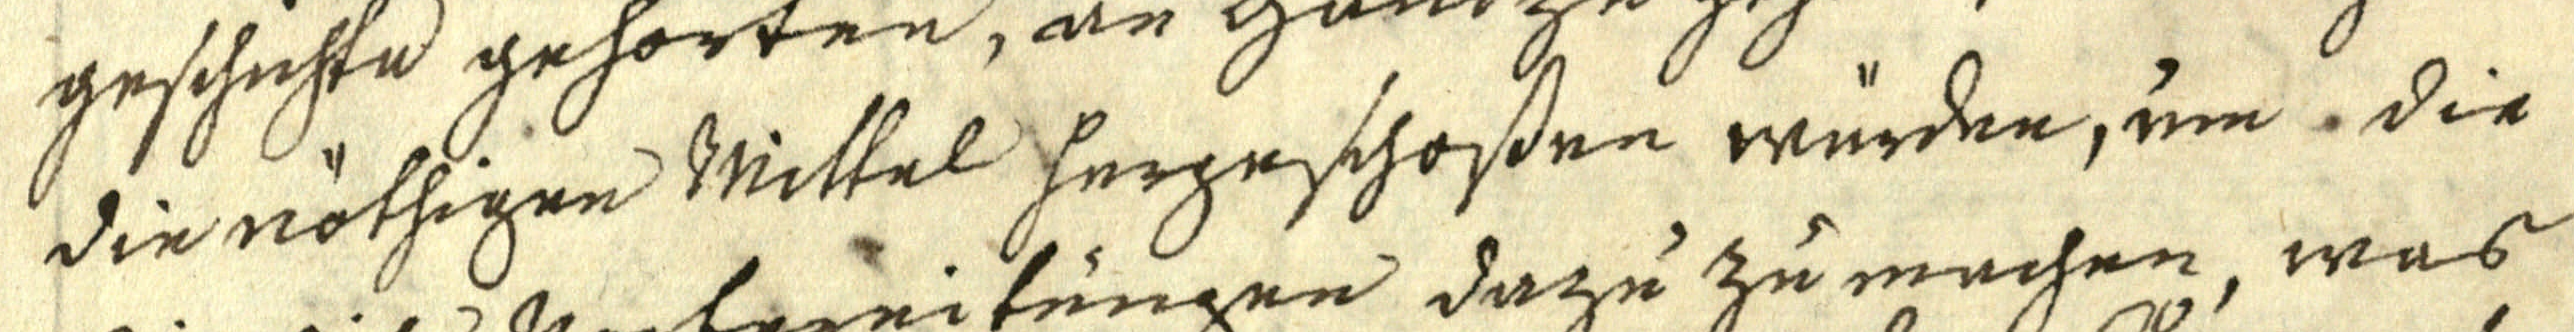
die nöthigen Mittel hergeschoßen würden, um die
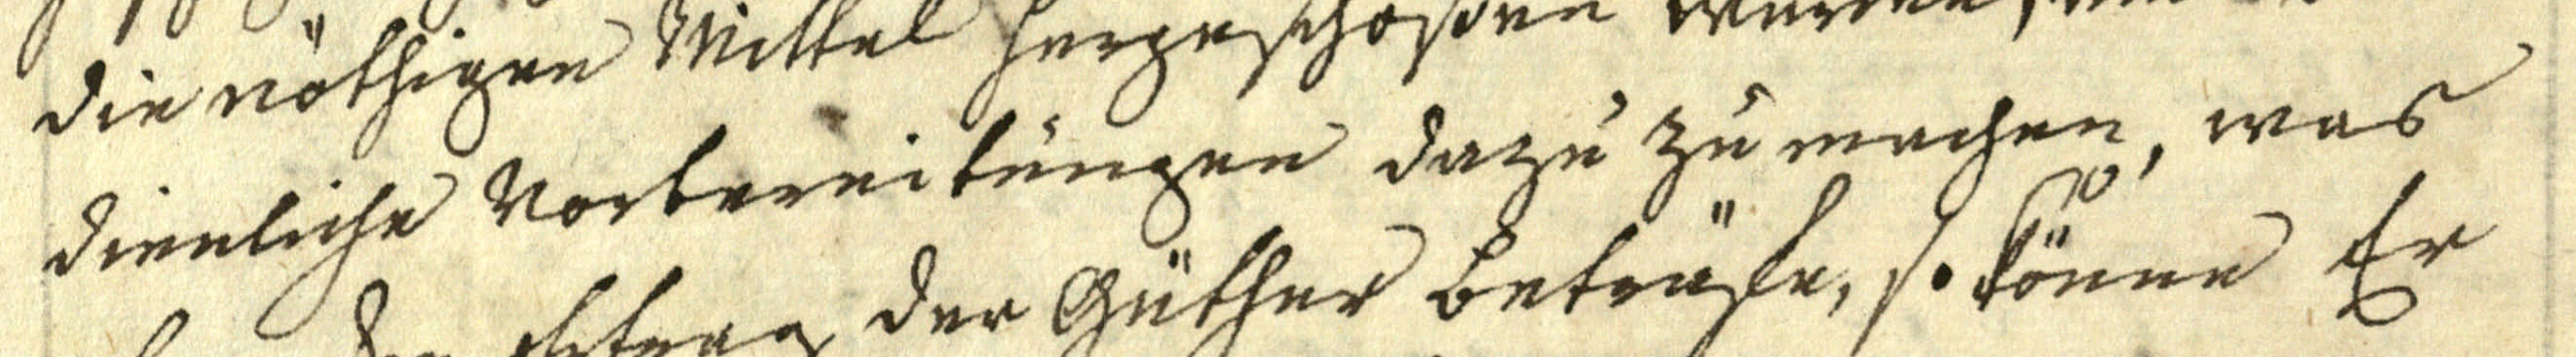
dienliche Vorbereitungen dazu zu machen, was
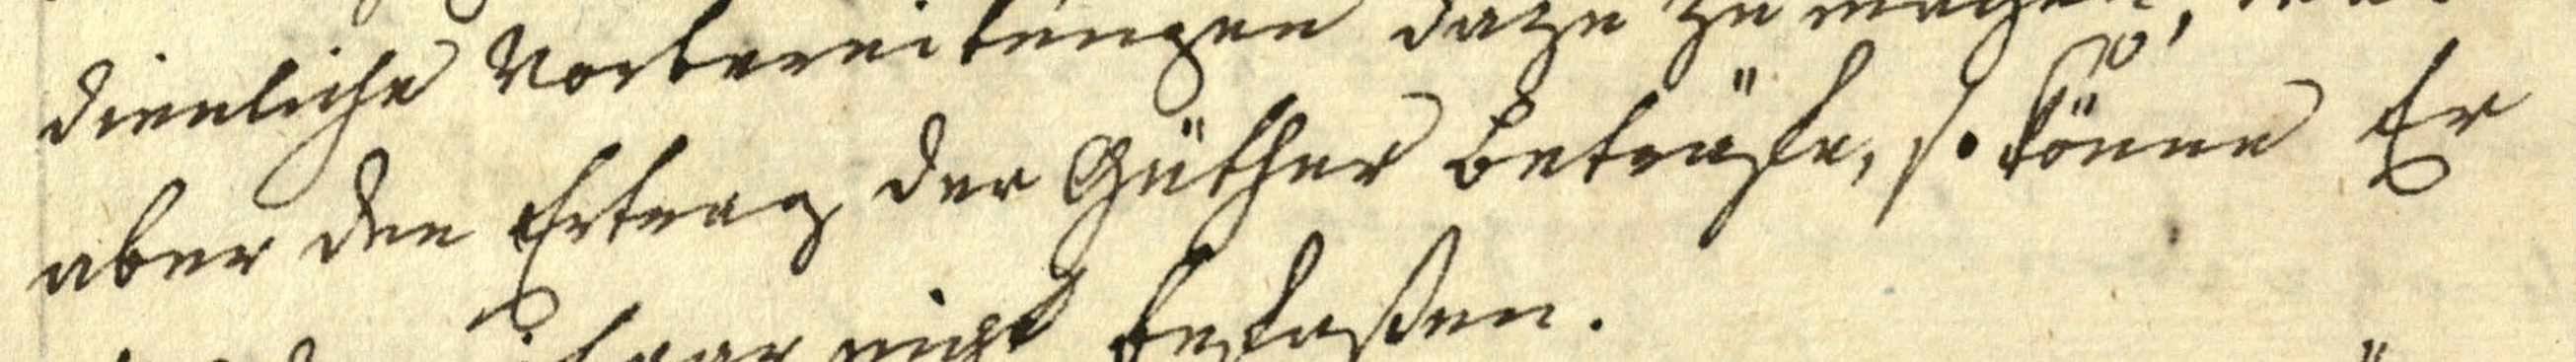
aber den Ertrag der Güther beträfe, so könne Er
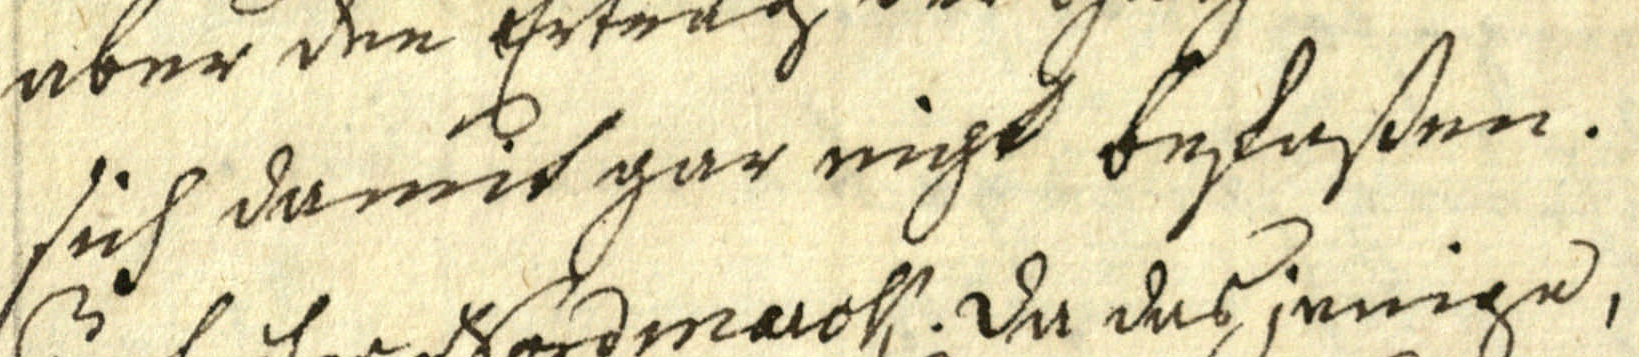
sich damit gar nicht befaßen.
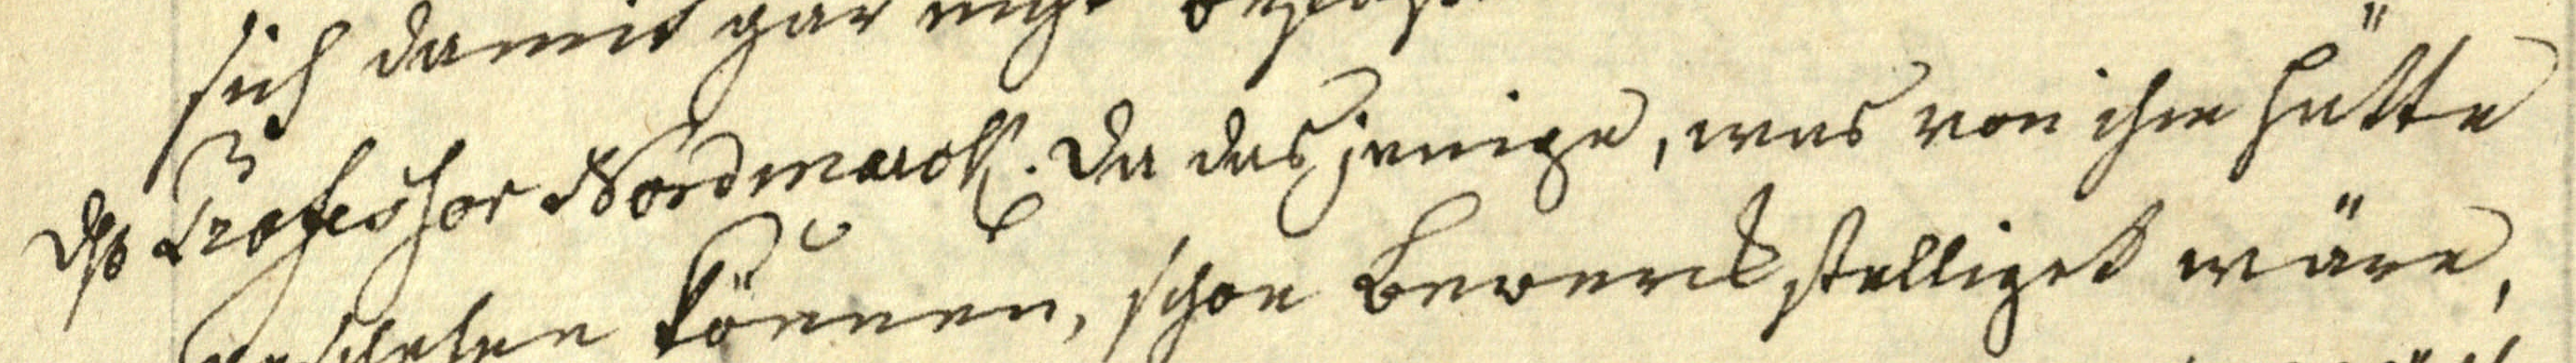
dh Professor Nordmarck. Da dasjenige, was von ihm hätte
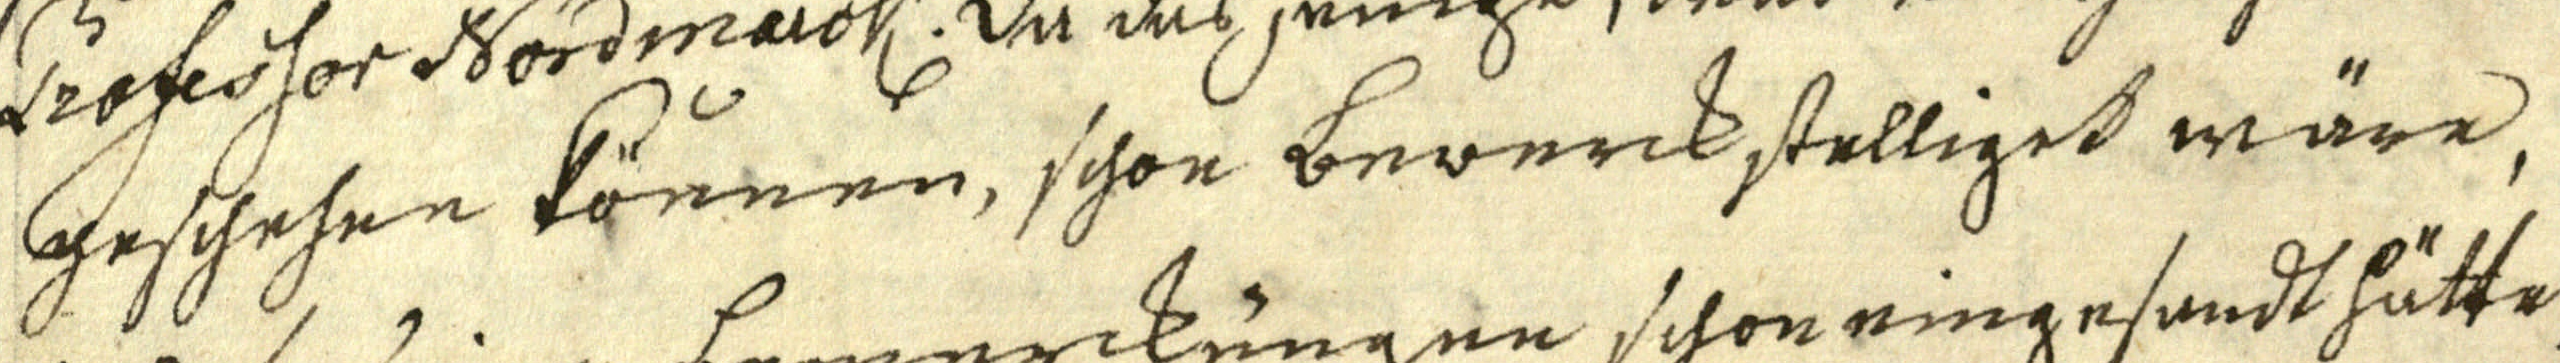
geschehen können, schon bewerckstelliget wäre,
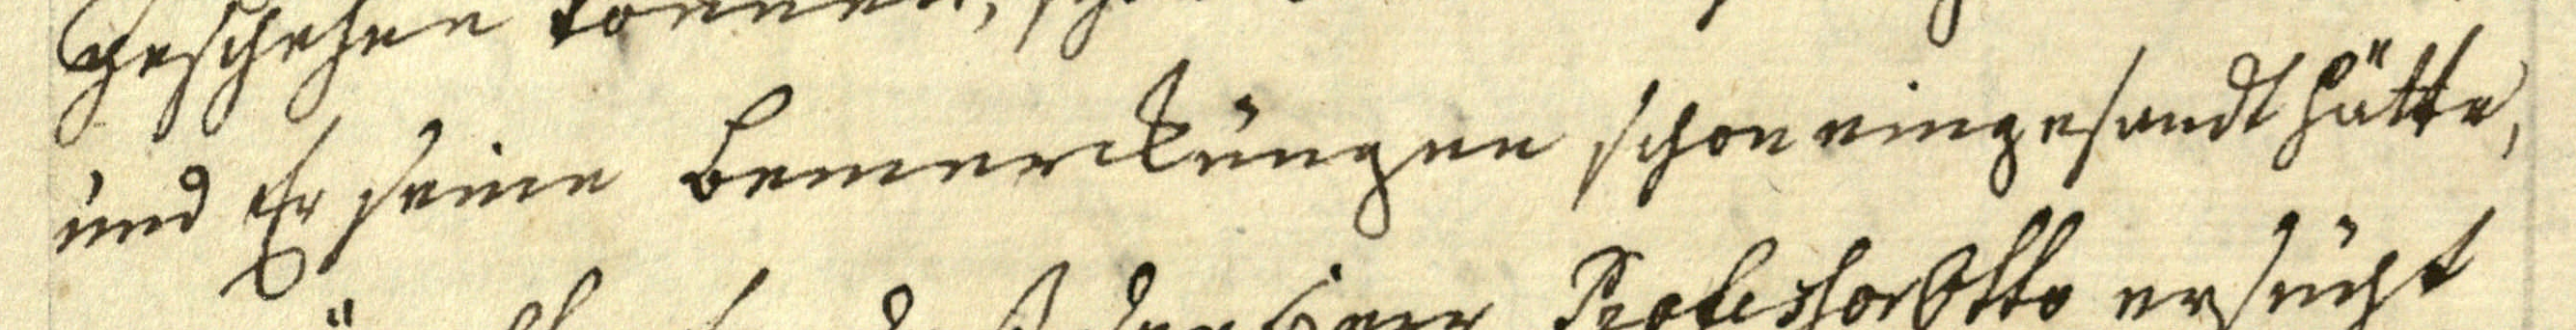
und Er seine Bemerckungen schon eingesandt hätte,
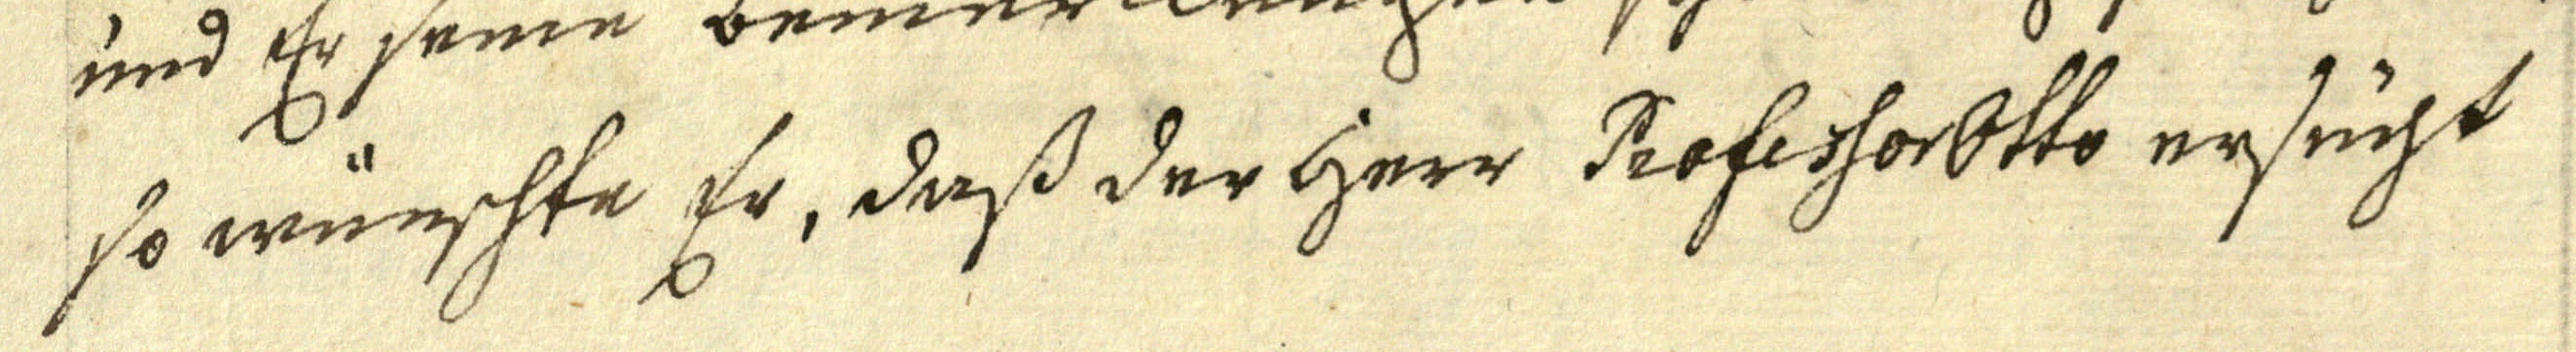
so wünschte Er, daß der Herr ProfessorOtto ersucht
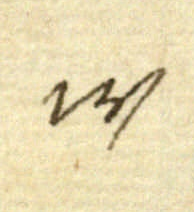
w
